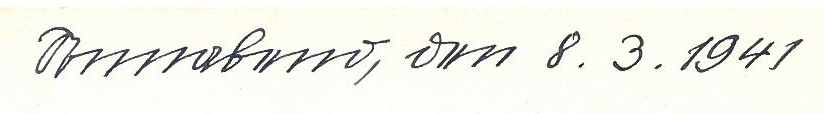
Sonnabend, den 8.3.1941
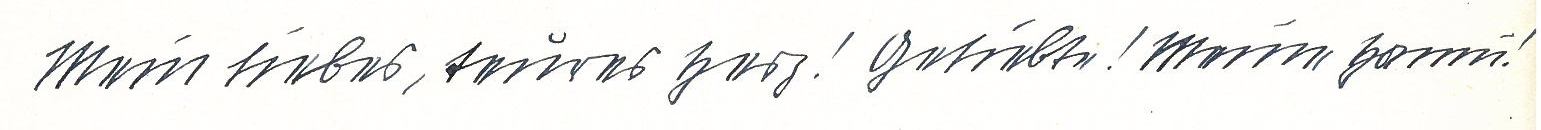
Mein liebes, teures Herz! Geliebte! Meine !
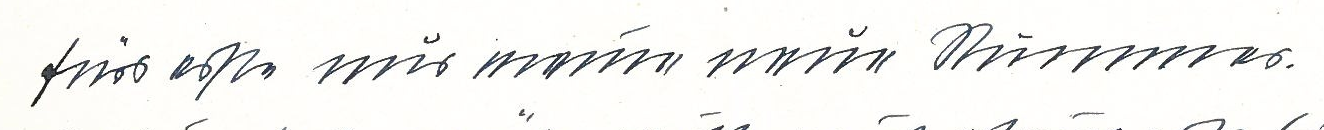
Fürs erste nur meine neue Nummer.
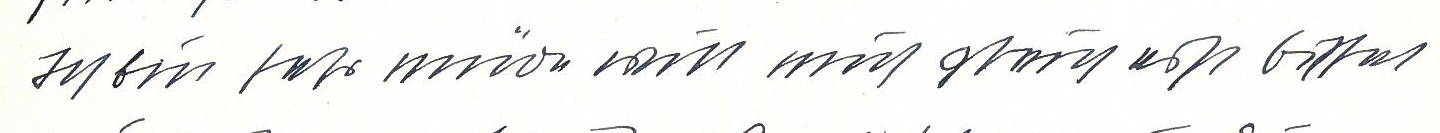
Ich bin sehr müde will mich gleich erst bissel
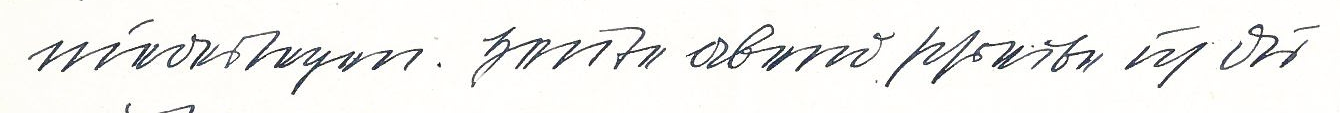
niederlegen. Heute abend schreibe ich dir
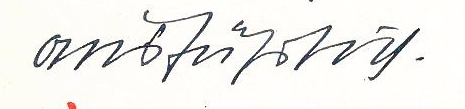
ausführlich.
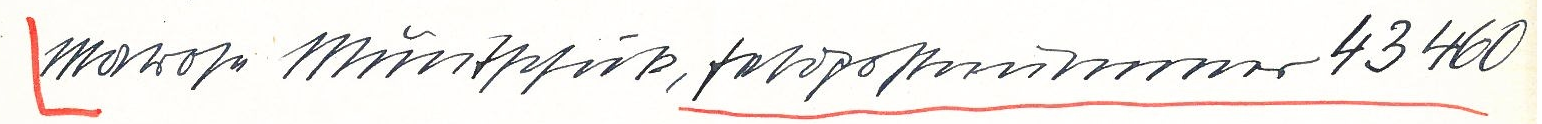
Matrose Feldpostnummer 43460
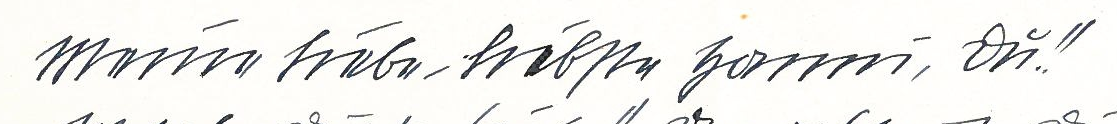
Meine liebe, liebste Hilde, Du!!
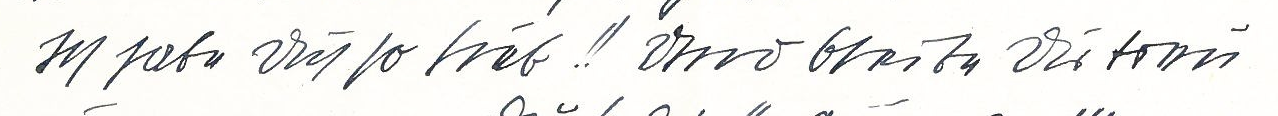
Ich habe dich so lieb!! Und bleibe dir treu
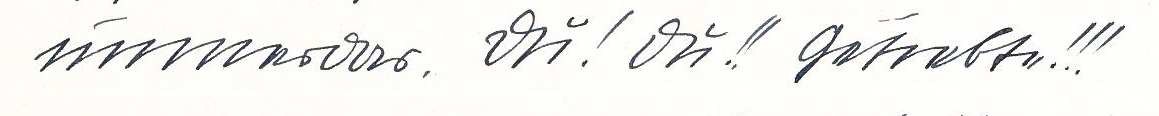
immerdar. Du! Du !! Geliebte !!!
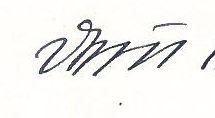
Dein
